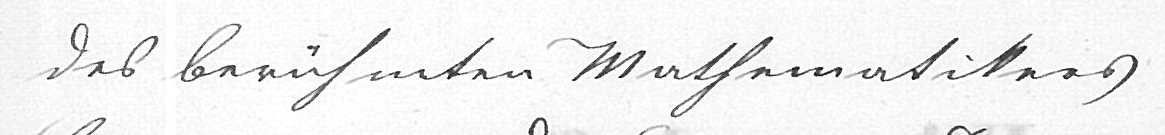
des berühmten Mathematikers
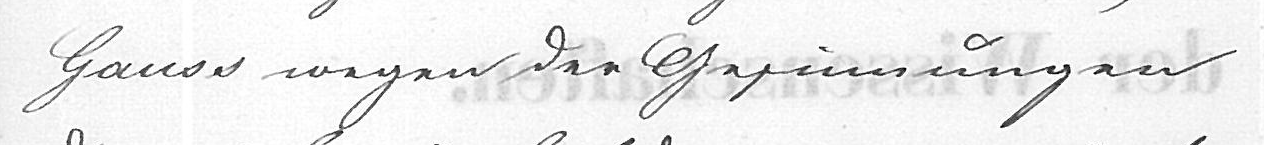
Gauss wegen der Gesinnungen
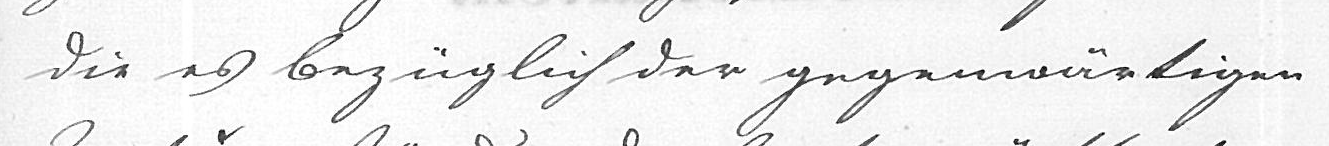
die es bezüglich der gegenwärtigen
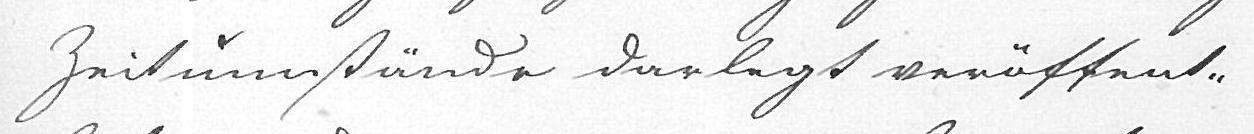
Zeitumstände darlegt veröffent-
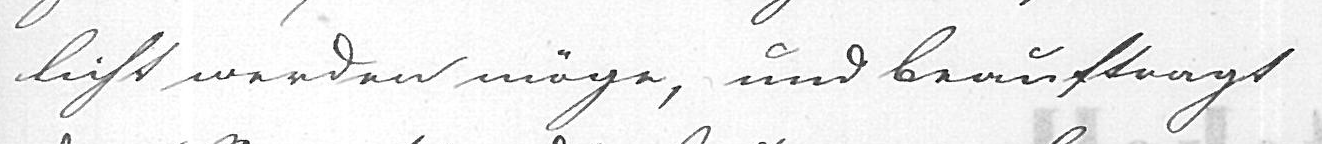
licht werden möge, und beauftragt
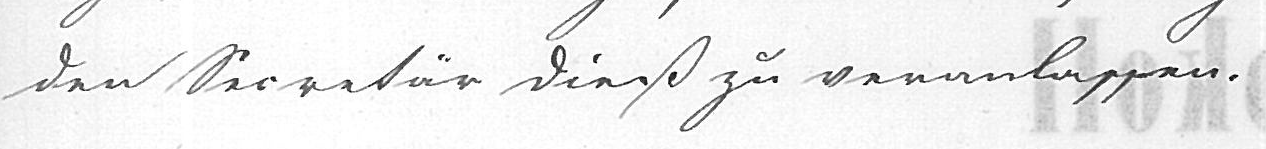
den Secretär dieß zu veranlassen.
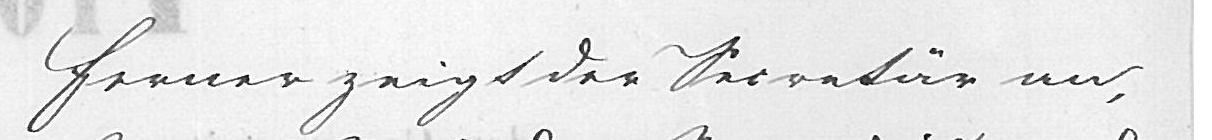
Ferner zeigt der Secretär an,
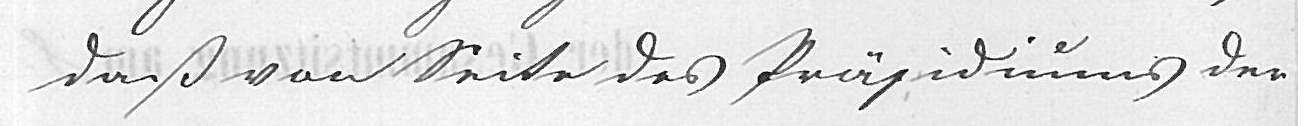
daß von Seite des Präsidiums der
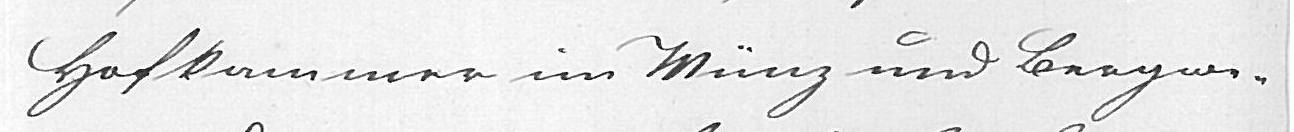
Hofkammer im Münz und Bergwe-
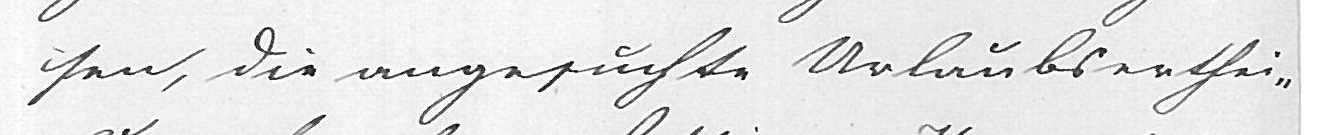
sen, die angesuchte Urlaubserthei-
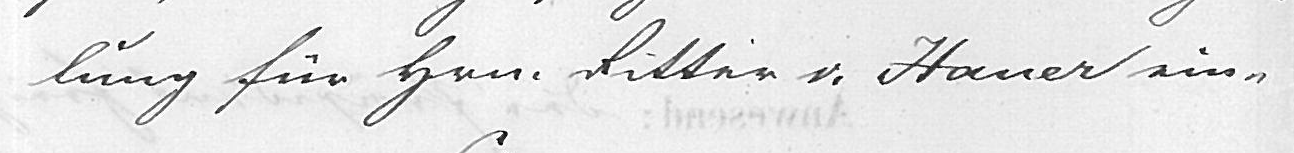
lung für Hrn. Ritter v. Hauer ein-
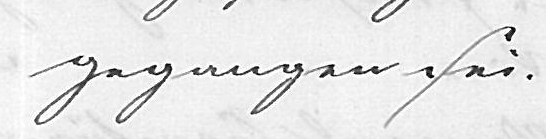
gegangen sei.
